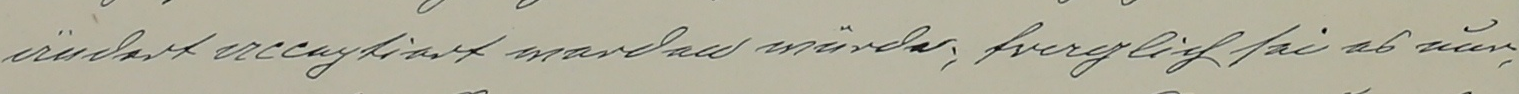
ändert acceptiert werden würde; fraglich sei es nur,
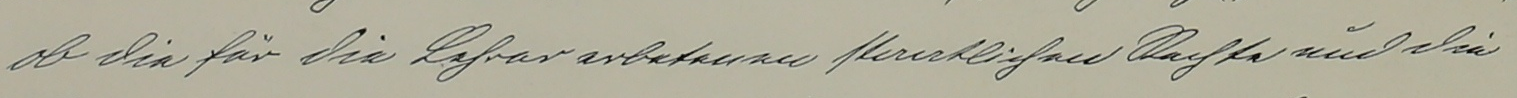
ob die für die Lehrer erbetenen staatlichen Rechte und die
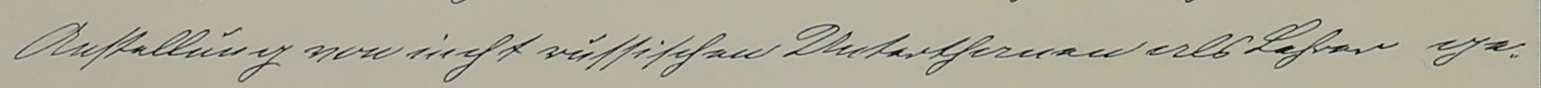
Anstellung von nichtrussischen Unterthanen als Lehrer ge-
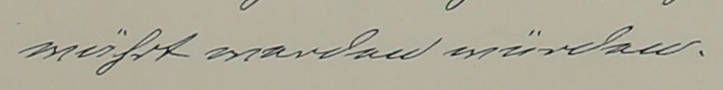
währt werden würden.
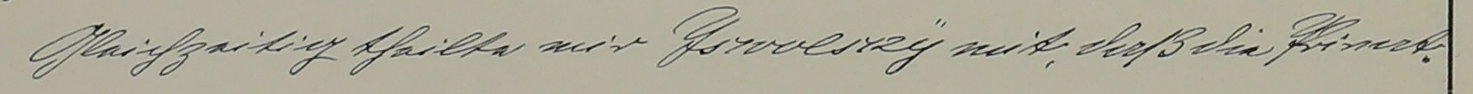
Gleichzeitig theilte mir Iswolsky mit, daß die Privat-
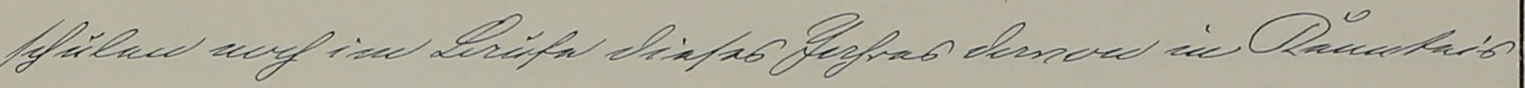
schulen noch im Laufe dieses Jahres davon in Kenntnis
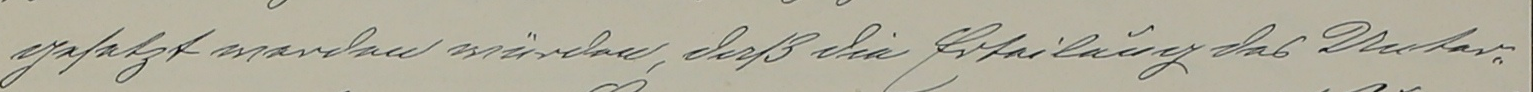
gesetzt werden würden, daß die Erteilung des Unter-
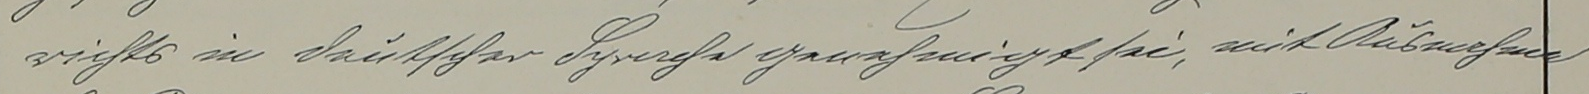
richts in deutscher Sprache genehmigt sei, mit Ausnahme
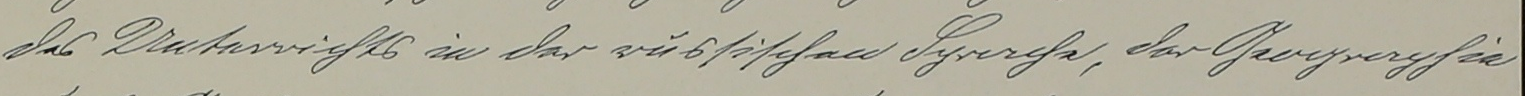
des Unterrichts in der russischen Sprache, der Geographie
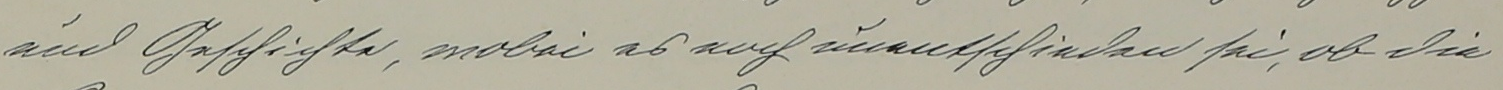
und Geschichte, wobei es noch unentschieden sei, ob die
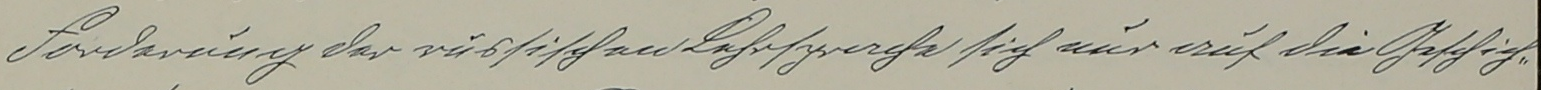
Forderung der russischen Lehrsprache sich nur auf die Geschich-
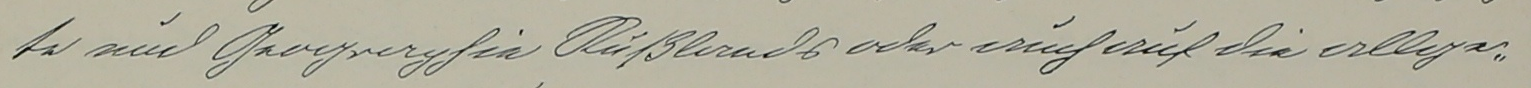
te und Geographie Rußlands oder auch auf die allge-
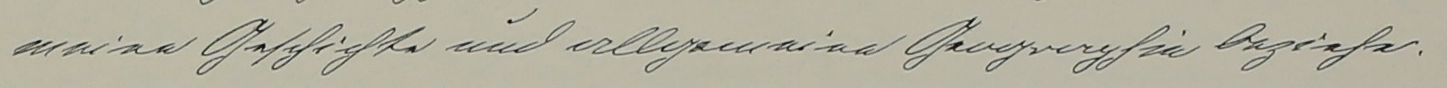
meine Geschichte und allgemeine Geographie beziehe.
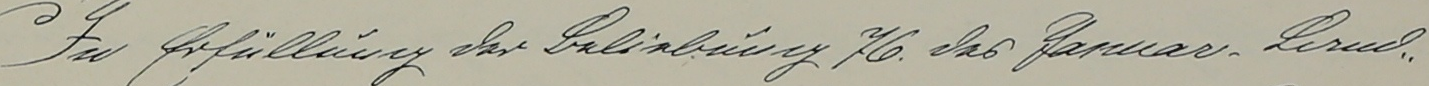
In Erfüllung der Beliebung 76. des Januar-Land-
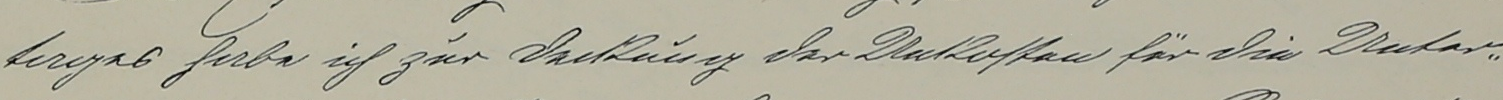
tages habe ich zur Deckung der Unkosten für die Unter-
